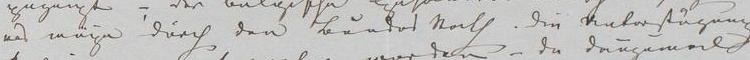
es möge durch den Bundes Rath – die Unterstüzung
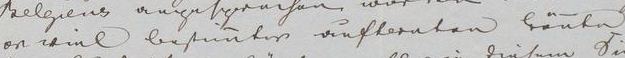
er viel bestimmter auftreten könnte.
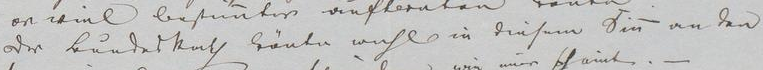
Der BundesRath könte wohl in diesem Sinn an den
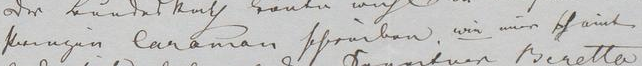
Prinzen Caraman schreiben, wie mir scheint. –
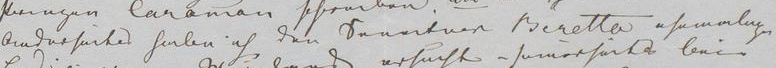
Anderseits habe ich den Senator Beretta ehemaliger
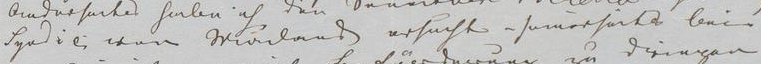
Syndic von Mailand ersucht – seinerseits bei
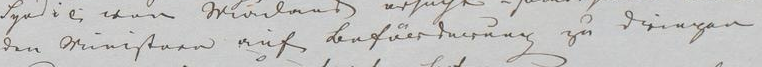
den Ministern auf Beförderung zu dringen
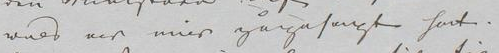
was er mir zugesagt hat.
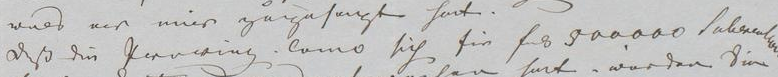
Daß die Provinz – Como sich für frs 300,000 Subvention
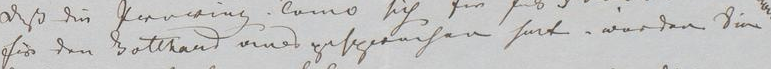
für den Gotthard ausgesprochen hat – werden Sie
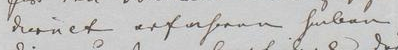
bereits erfahren haben.
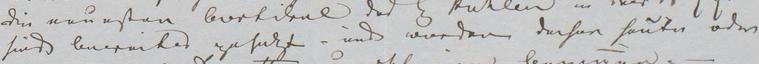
sind bereits gesetzt – und werden daher heute oder
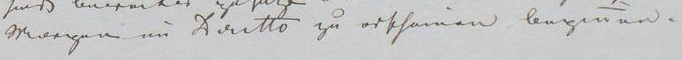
Morgen im Diritto zu erscheinen beginnen. –
